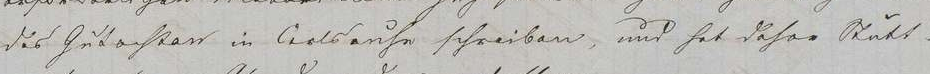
das Gutachten in Carlsruhe schreiben, und hat daher Stutt-
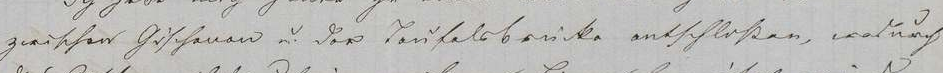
zwischen Göschenen u. der Teufelsbrücke entschloßen, wodurch
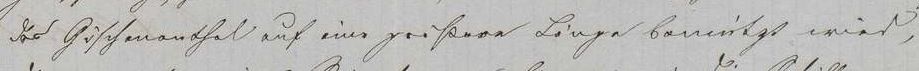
das Göschenenthal auf eine größere Länge benützt wird,
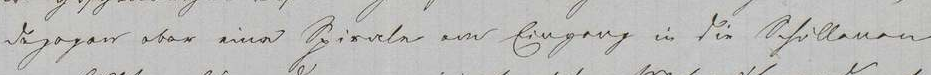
dagegen aber eine Spirale am Eingang in die Schöllenen
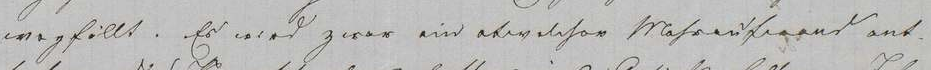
wegfällt. Es wird zwar ein etwelcher Mehraufwand ent-
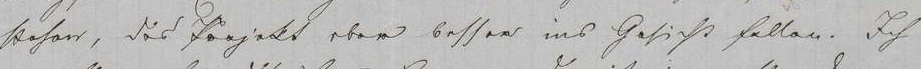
stehen, das Projekt aber besser ins Gesicht fallen. Ich
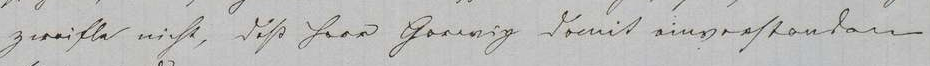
zweifle nicht, daß Herr Gerwig damit einverstanden
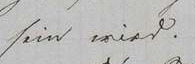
sein wird.
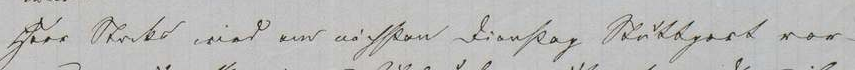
Herr Stocks wird am nächsten DienstagStuttgart ver-
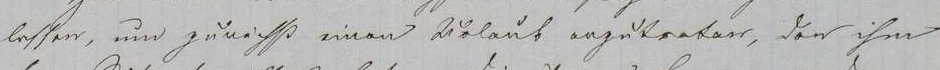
lassen, um zunächst einen Urlaub anzutreten, den ihm
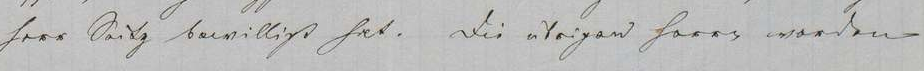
Herr Seitz bewilligt hat. Die übrigen Herrn werden
